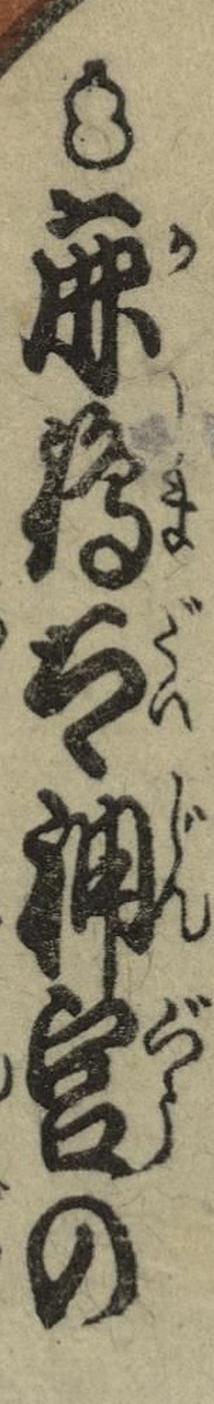鹿島太神宮の
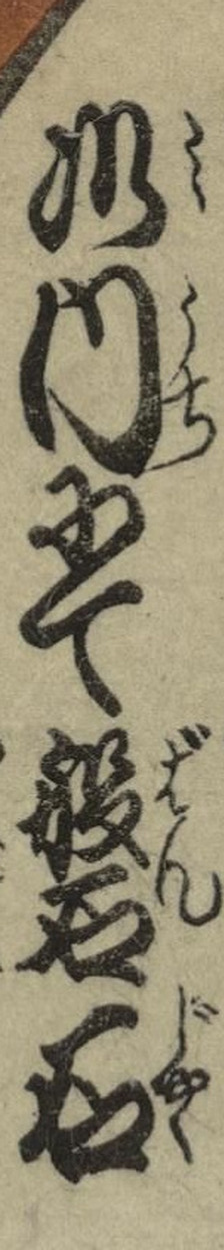御内にて磐石
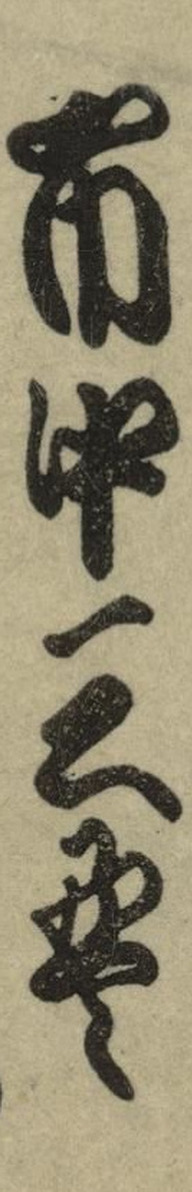市中三畳
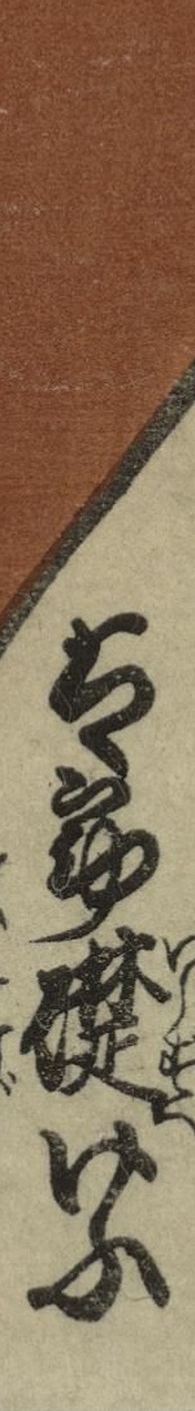太郎礎けふ
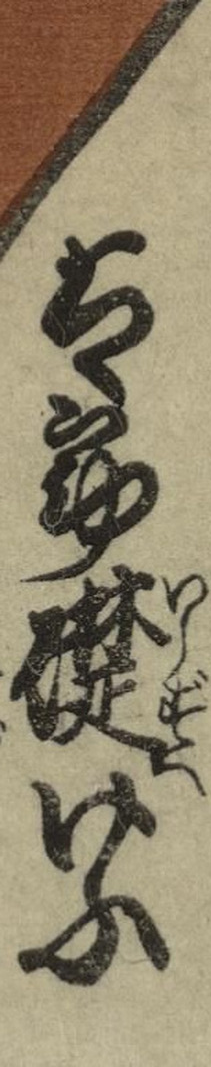太郎礎けふ
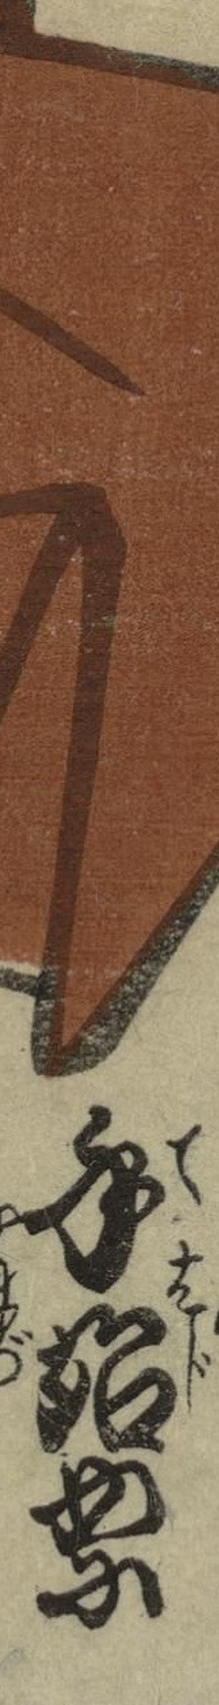手始めに
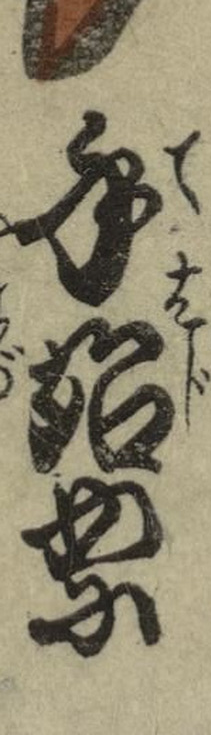手始めに
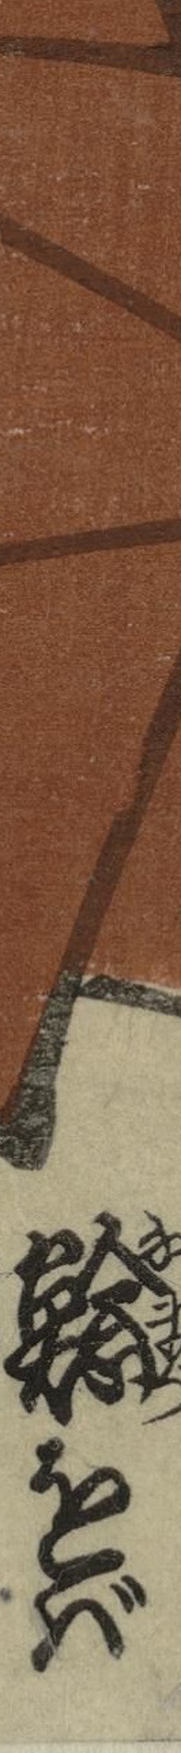鯰をば
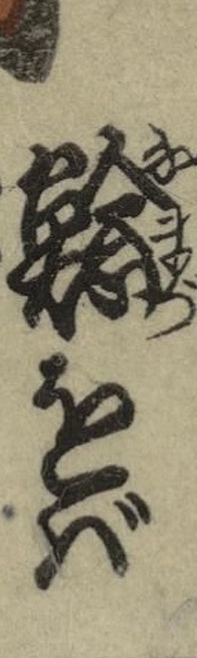鯰をば
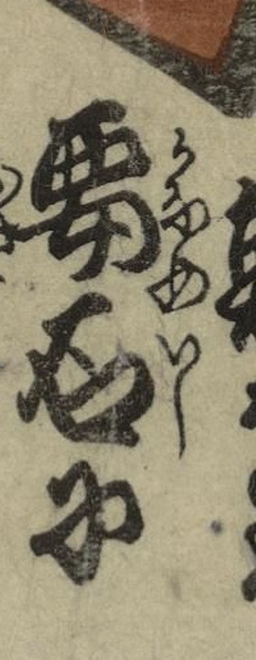要石に
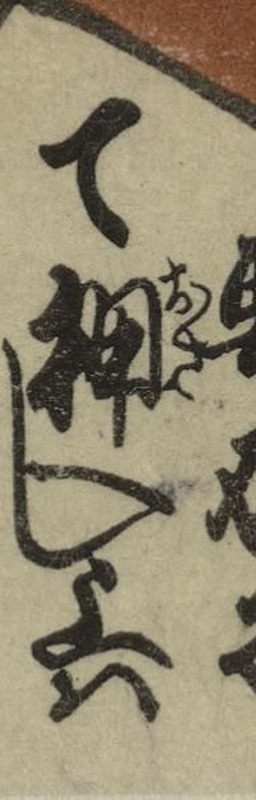て押へし上は
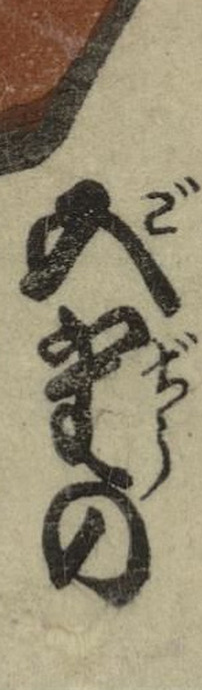五重の
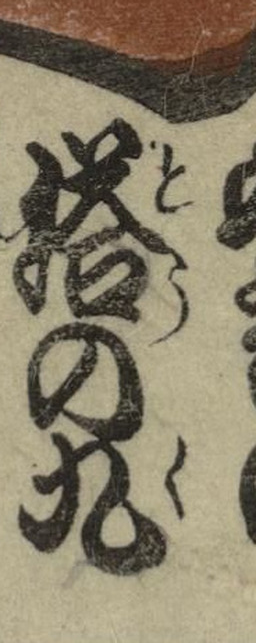塔の九
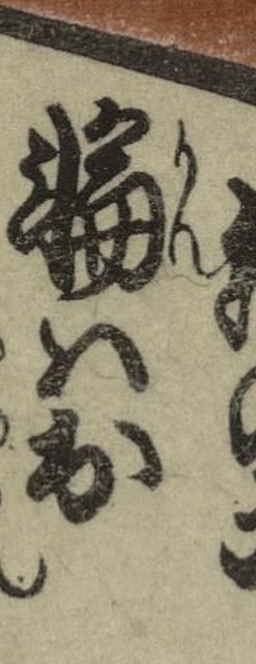輪はお
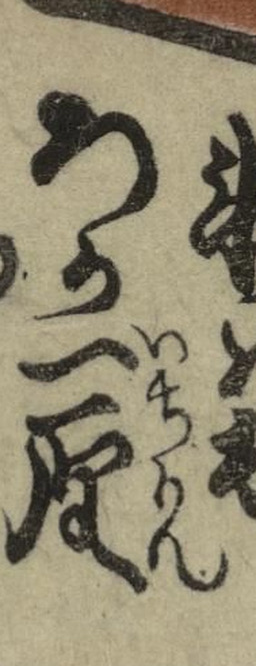ろか一厘
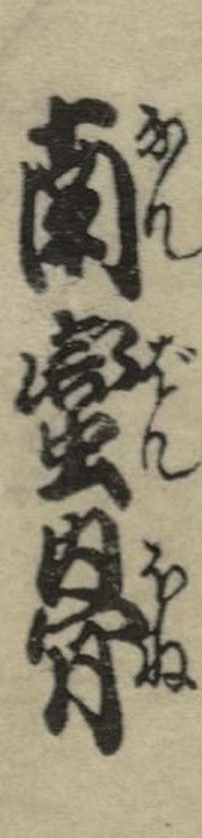南蛮骨
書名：しばらくのそとね
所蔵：東京大学地震研究所図書室 Earthquake Research Institute Library, The University of Tokyo, JAPAN
